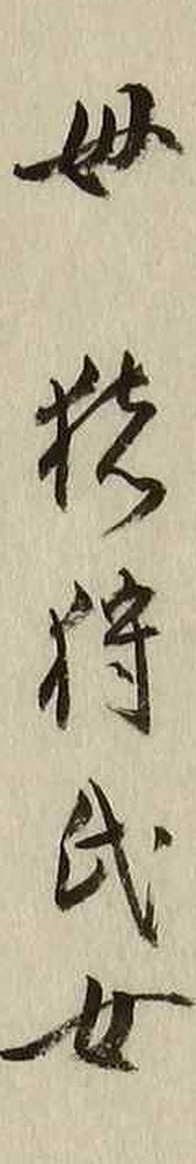母猪狩氏女
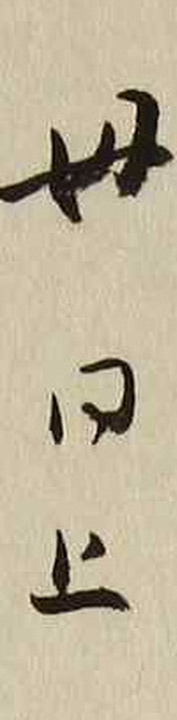母同上
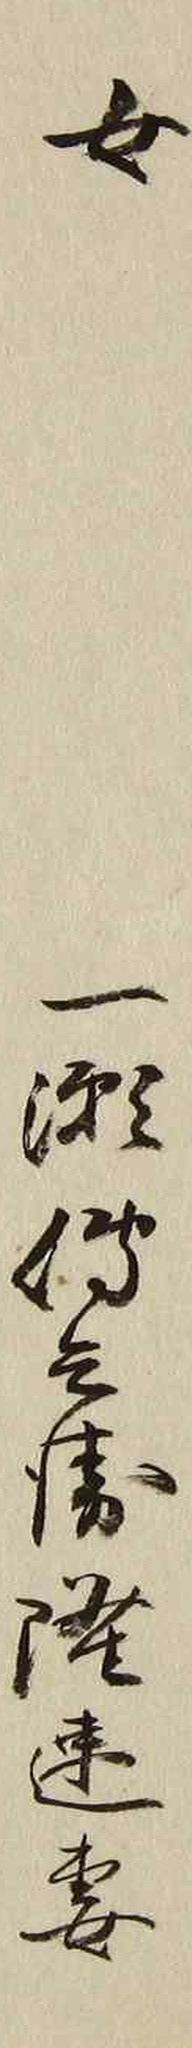女一瀬伝兵衛隆達妻
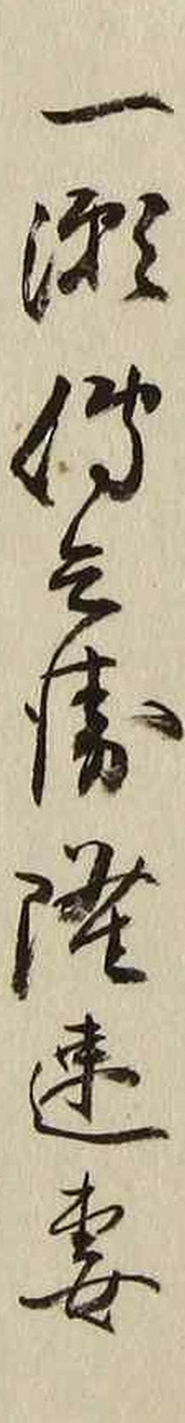女一瀬伝兵衛隆達妻
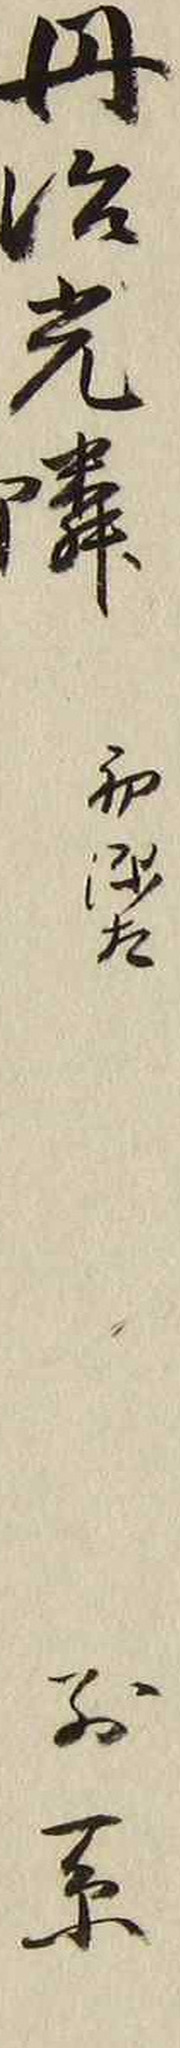丹治光隣初源太別系

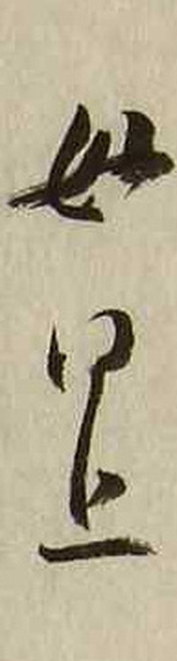母同上
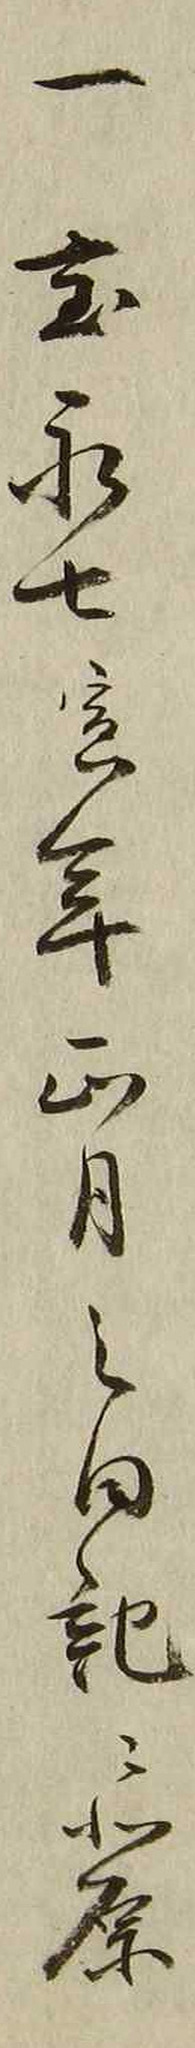一宝永七寅年正月之同記に北原
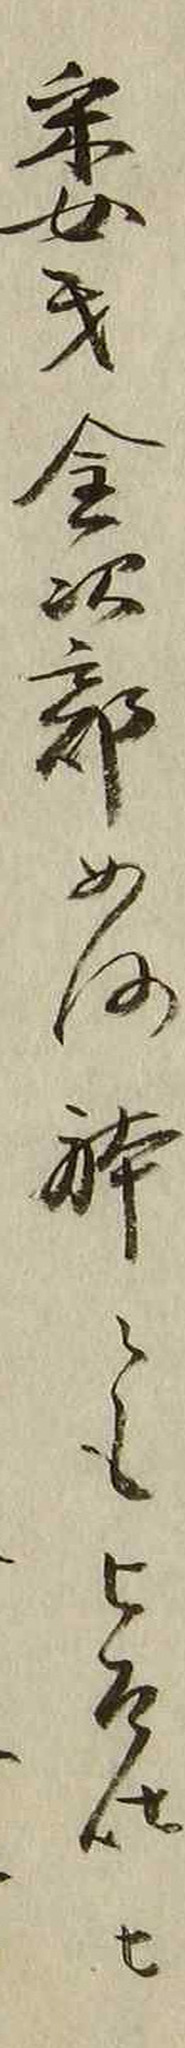采女義金次郎如何体にも被召仕被
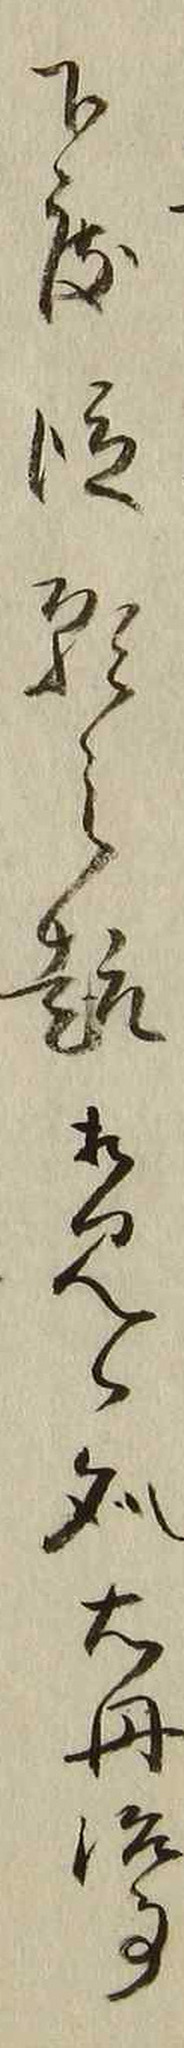下度段願之趣相見候処右丹治事
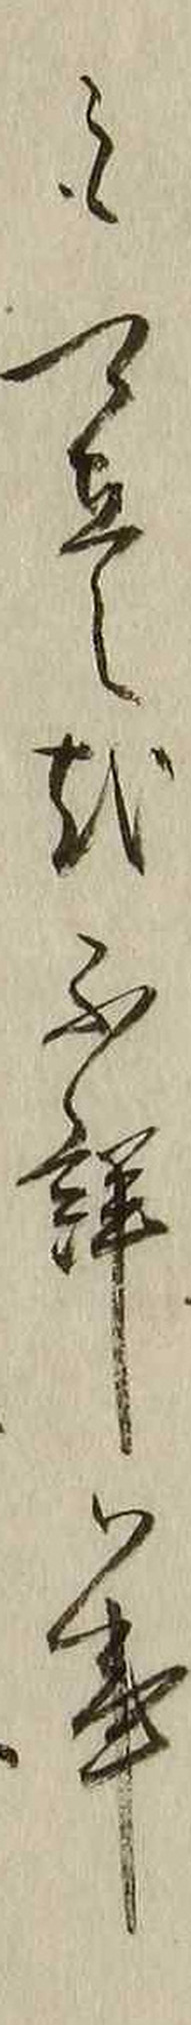にも可在之哉不詳候事
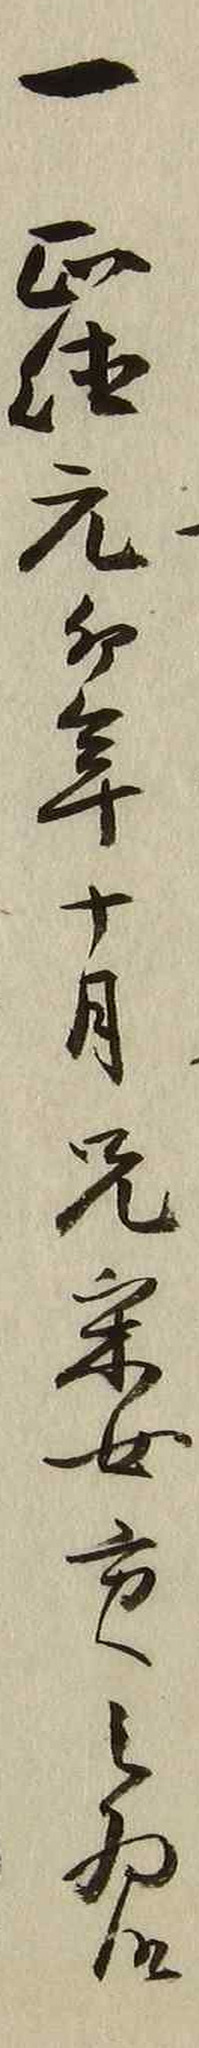一正徳元卯年十月兄采女方へ之為御
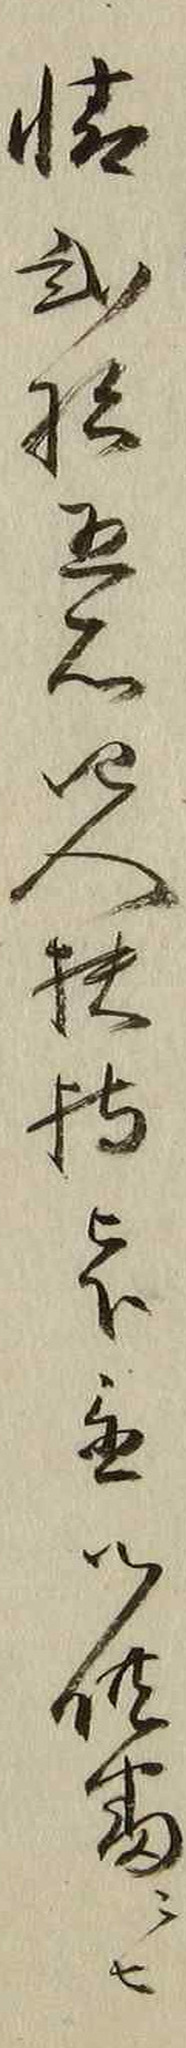情弐拾五石四人扶持被下置御供番被
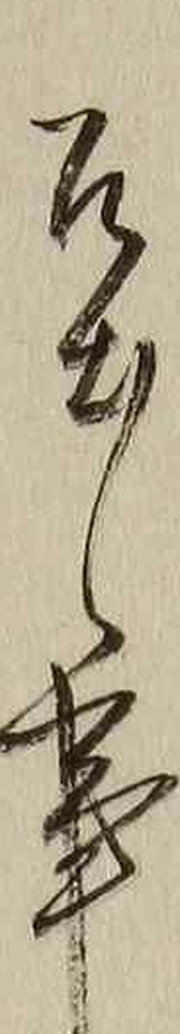召出候事
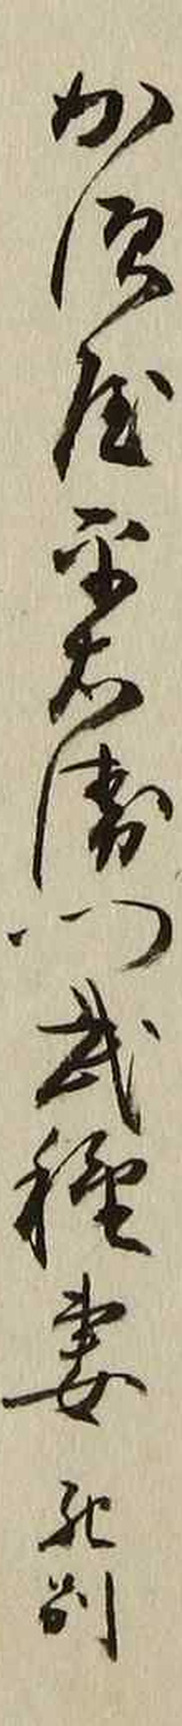女加須屋平右衛門武種妻死別
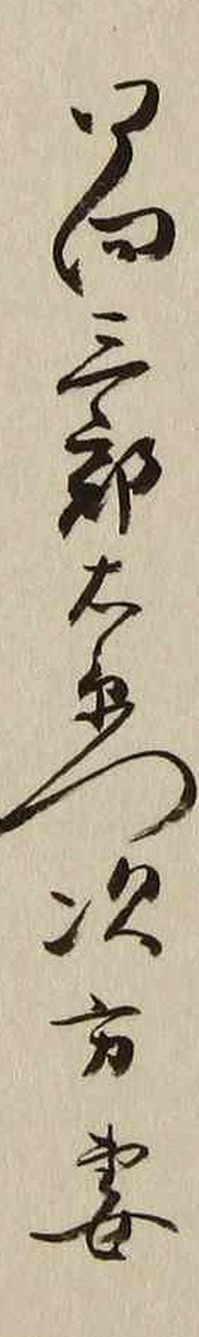日向三郎右衛門次方妻
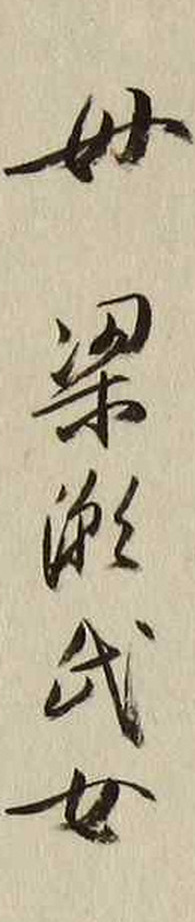母梁瀬氏女
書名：諸士系譜　巻之292　き之部1
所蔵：会津若松市立会津図書館
